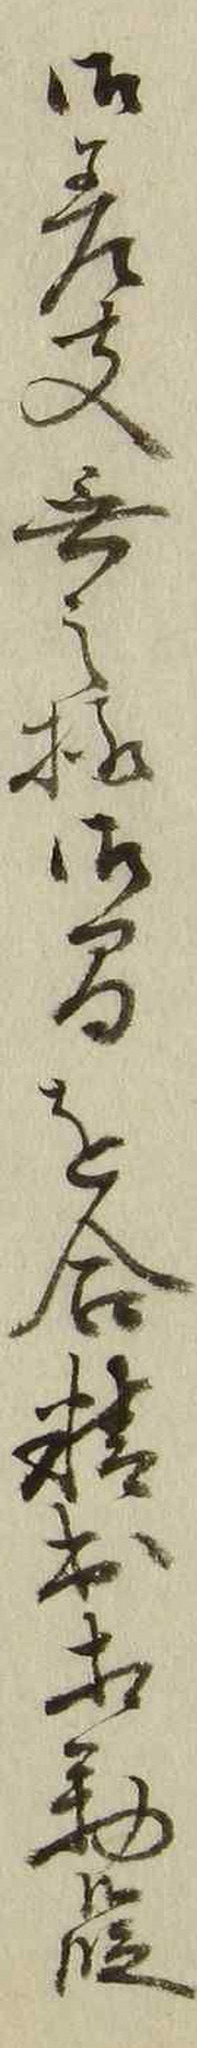御差支無之様御間を合精出相勤候段
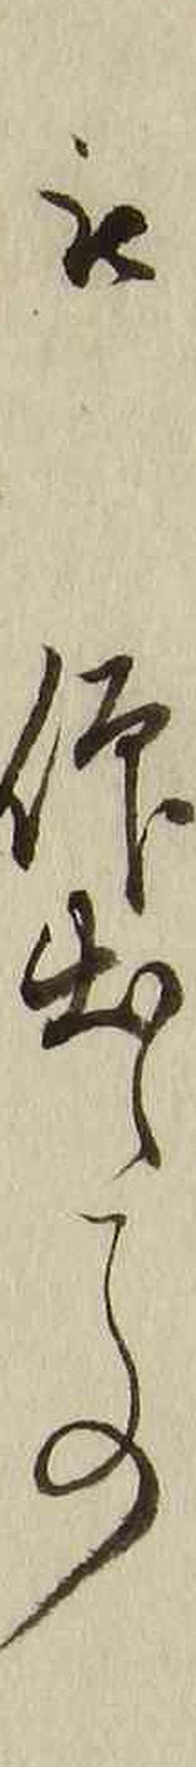被仰出候事
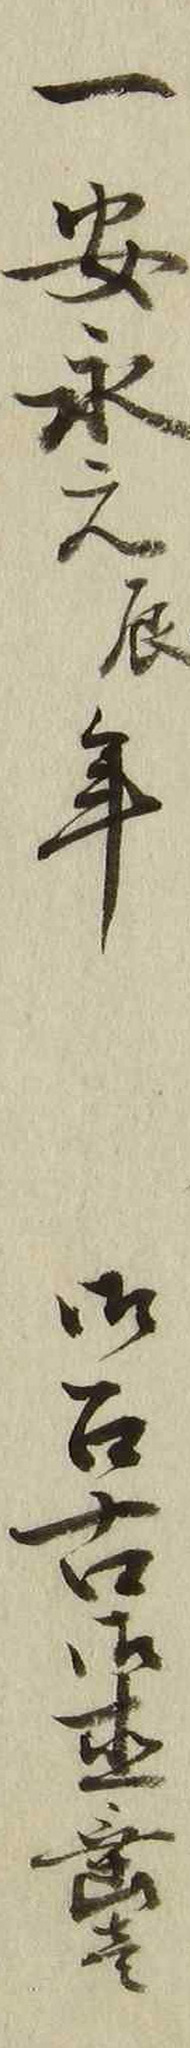一安永元辰年御召古御直垂壱
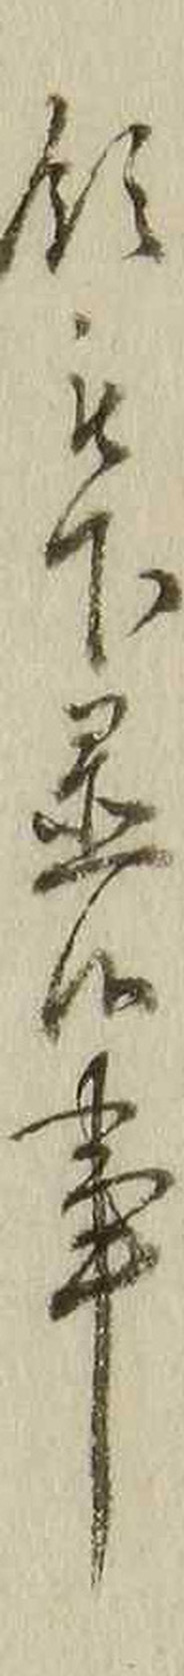領被下置候事
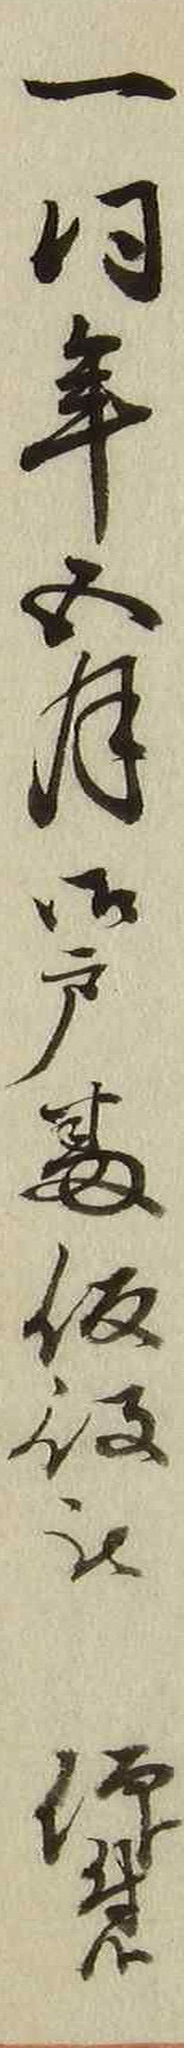一同年五月御戸番仮役被仰付候
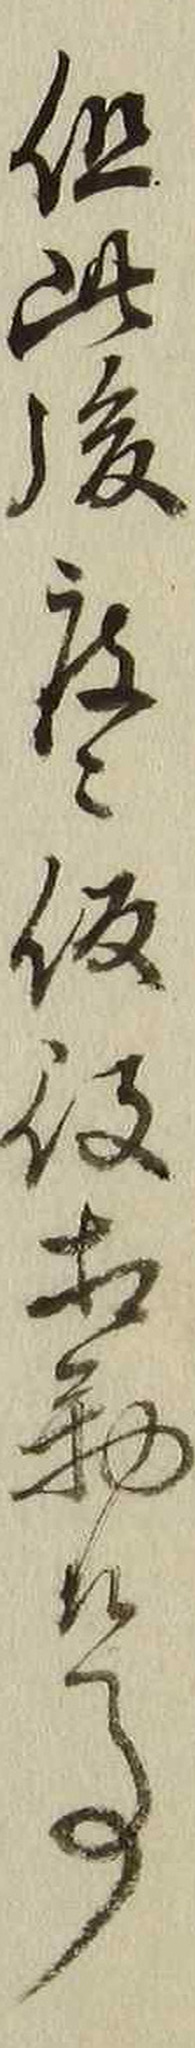但此後度々仮役相勤候事
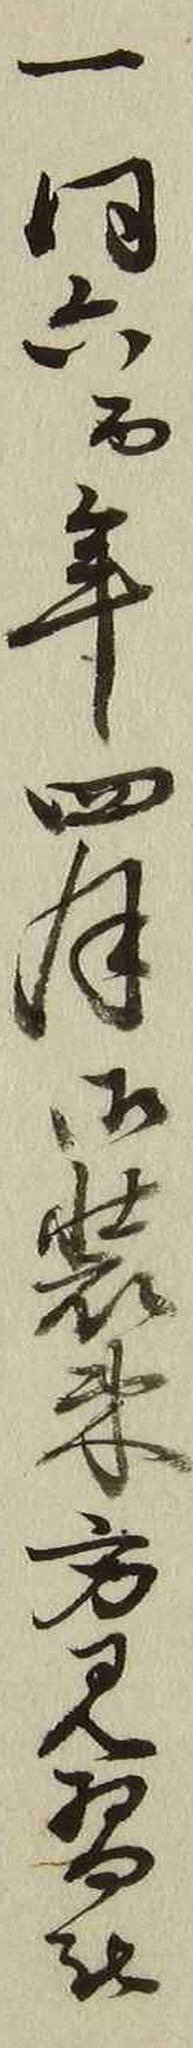一同六酉年四月御装束方見習被
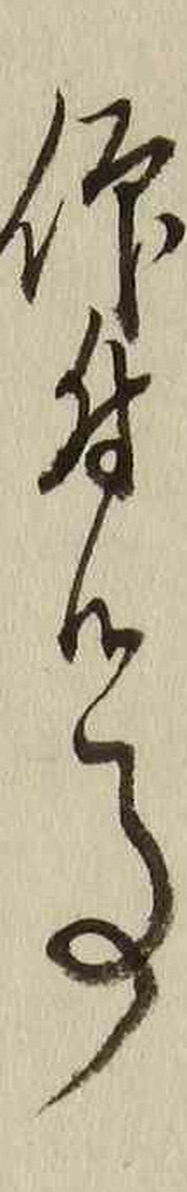仰付候事
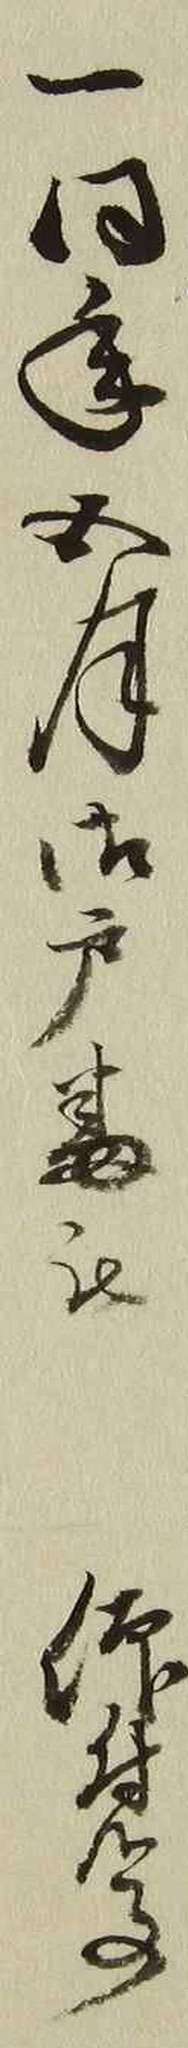一同年五月御戸番被仰付候事
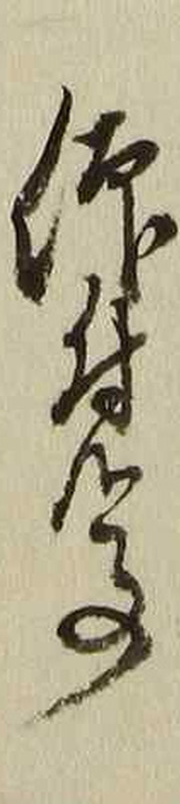仰付候事
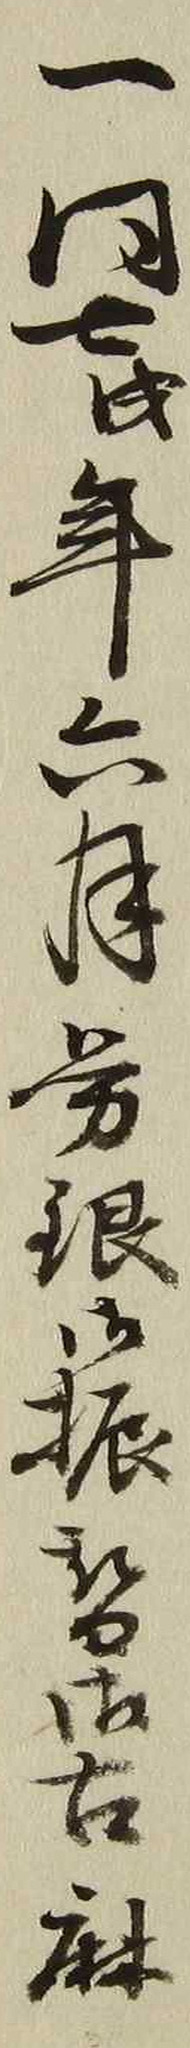一同七戌年六月労銀御振替御古麻
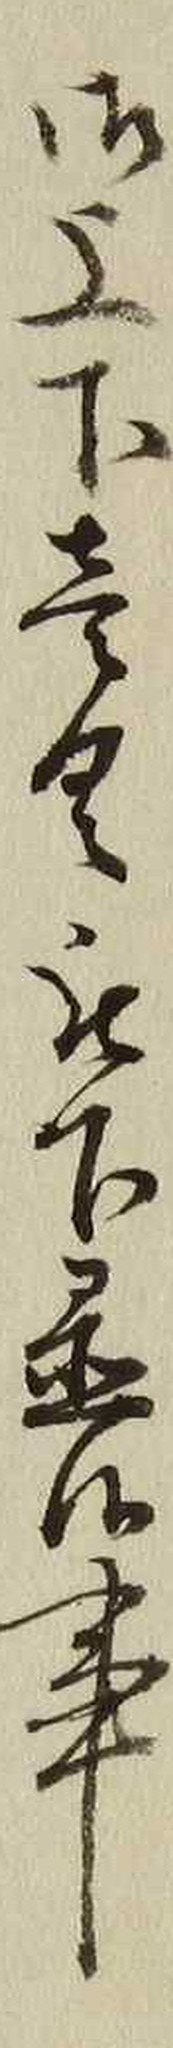御上下壱具被下置候事
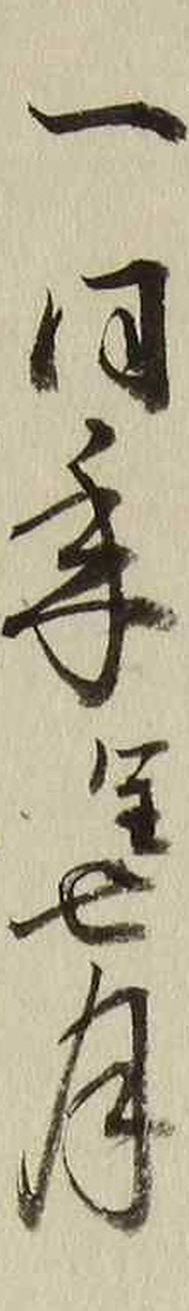一同年閏七月
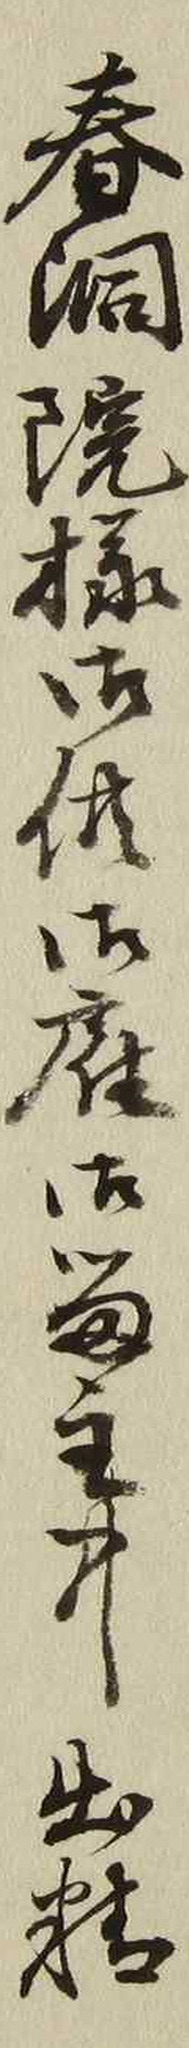春洞院様御供御雇御留主中出精
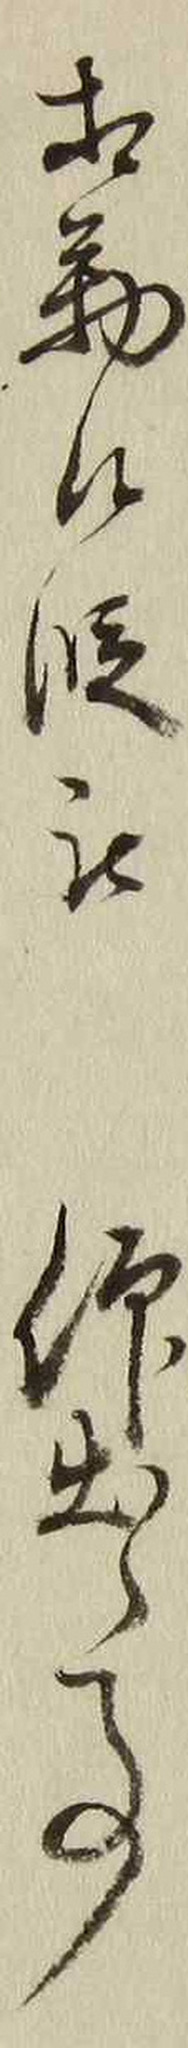相勤候段被仰出候事
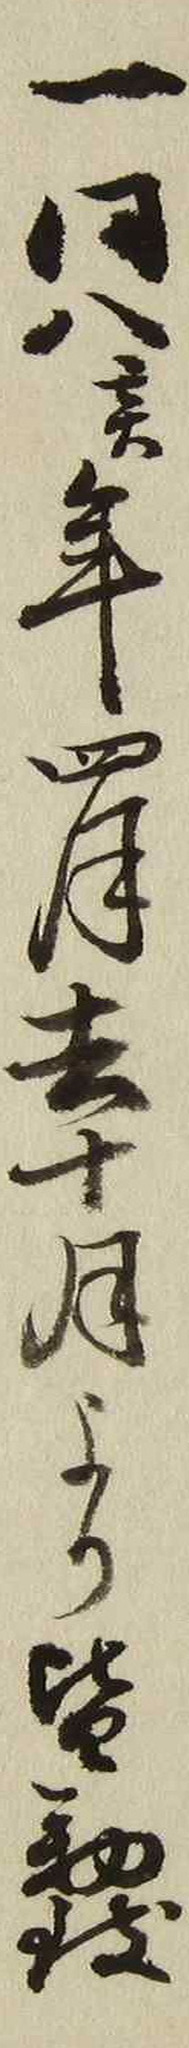一同八亥年四月去十月より皆勤致
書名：諸士系譜　巻之35　は之部3
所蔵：会津若松市立会津図書館
